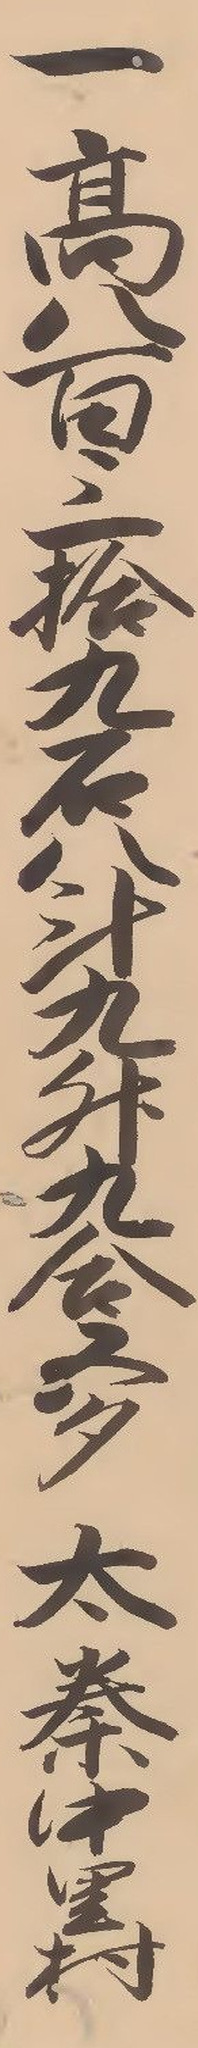一高八百三拾九石八斗九升九合五勺太秦中里村

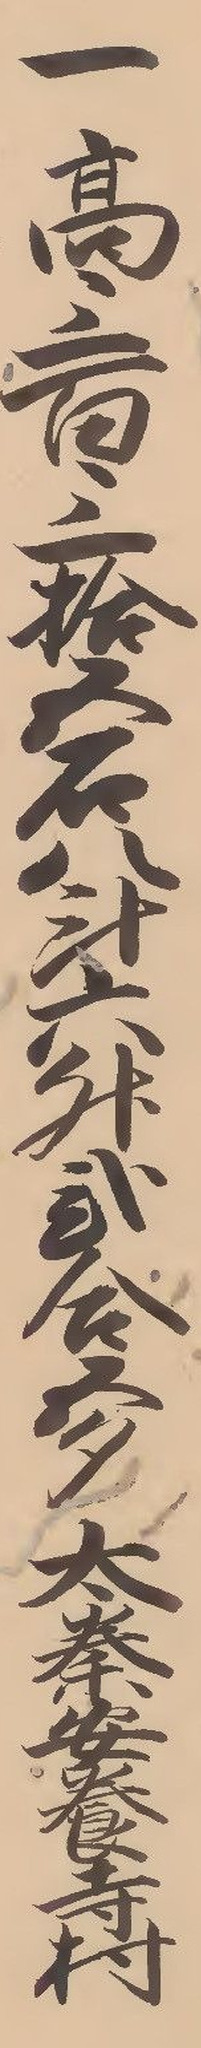一高三百三拾五石八斗六升弐合五勺太秦安養寺村
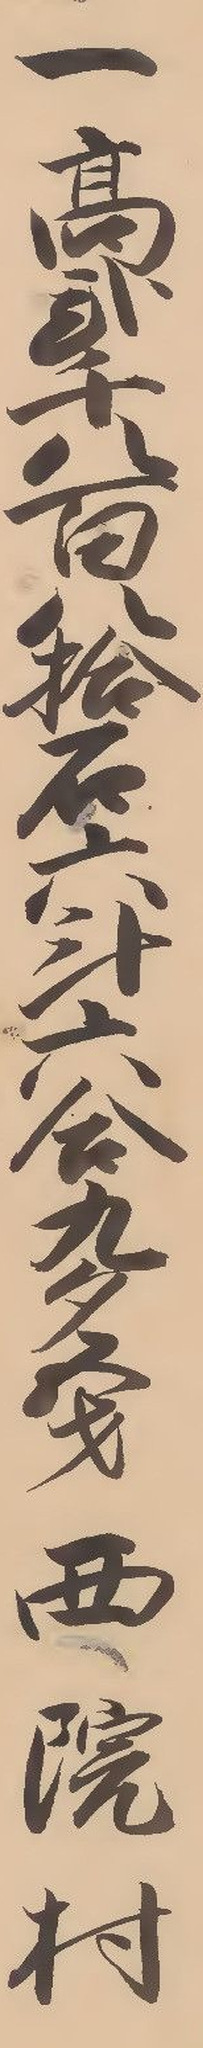一高弐千八百八拾石六斗六合九勺五才西院村
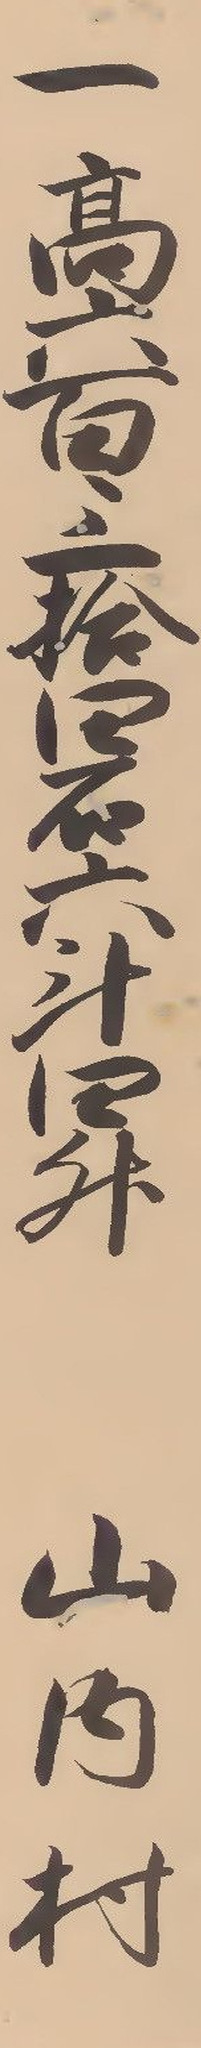一高六百三拾四石六斗四升山内村
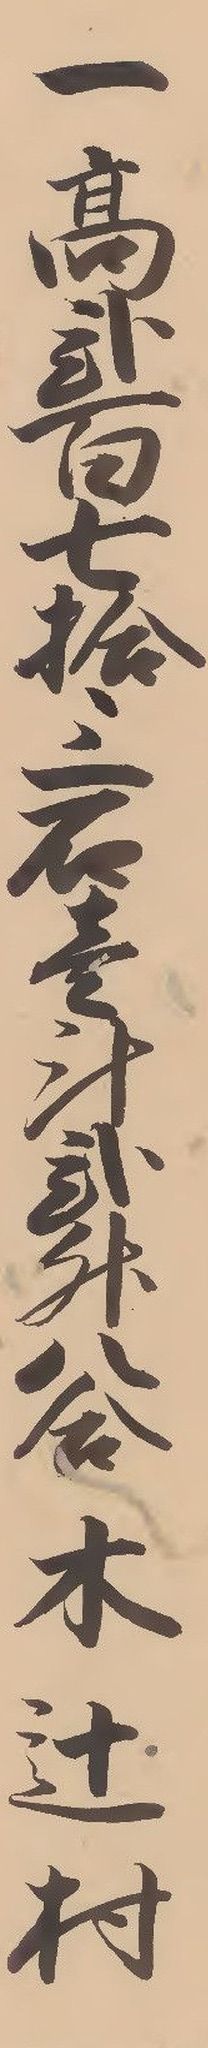一高弐百七拾三石壱斗弐升八合木辻村
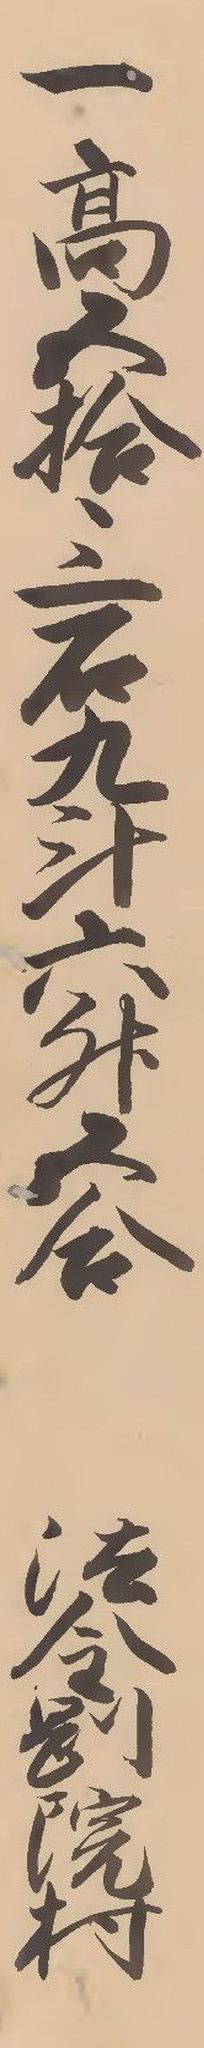一高五拾三石九斗六升五合法金剛院村

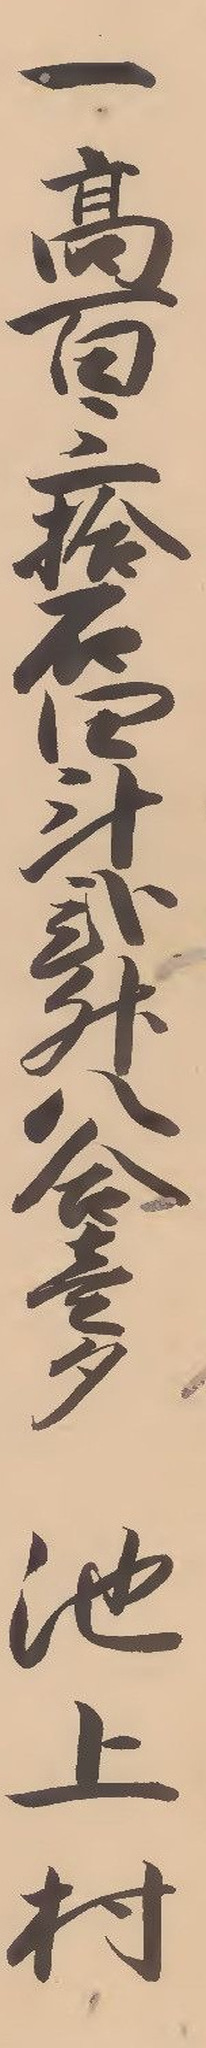一高百三拾石四斗弐升八合壱勺池上村
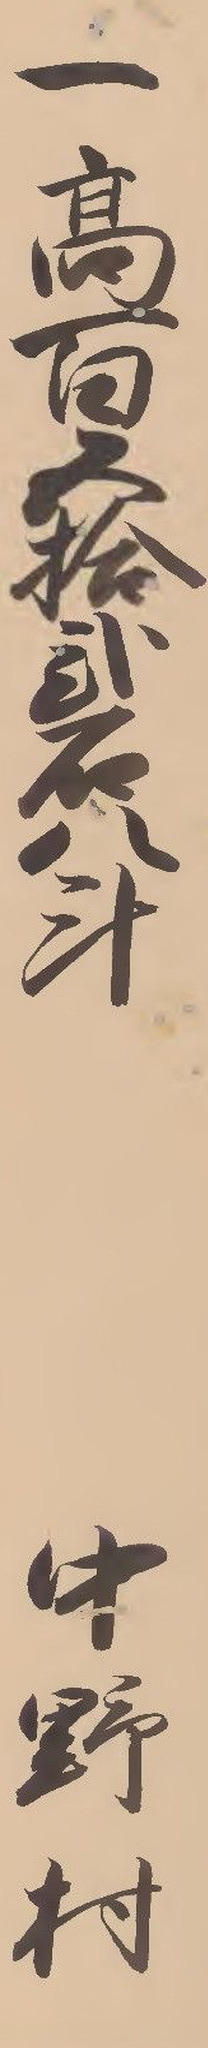一高百五拾弐石八斗中野村
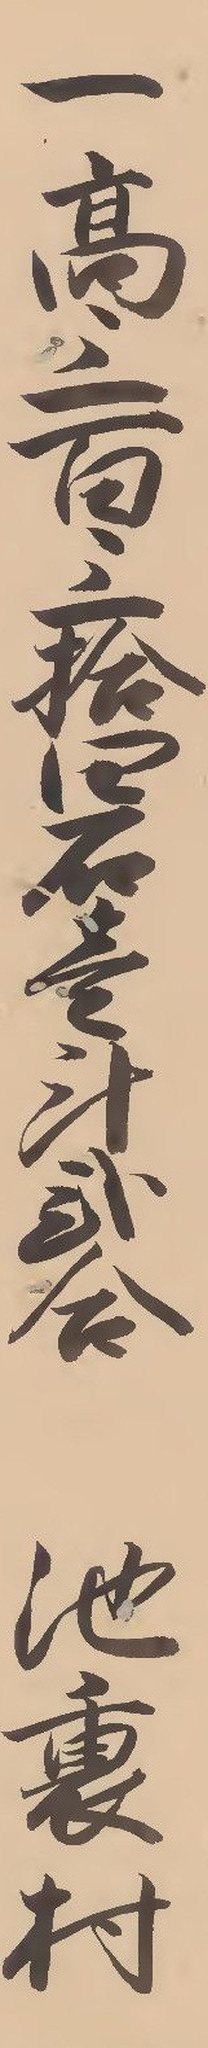一高三百三拾四石壱斗弐合池裏村
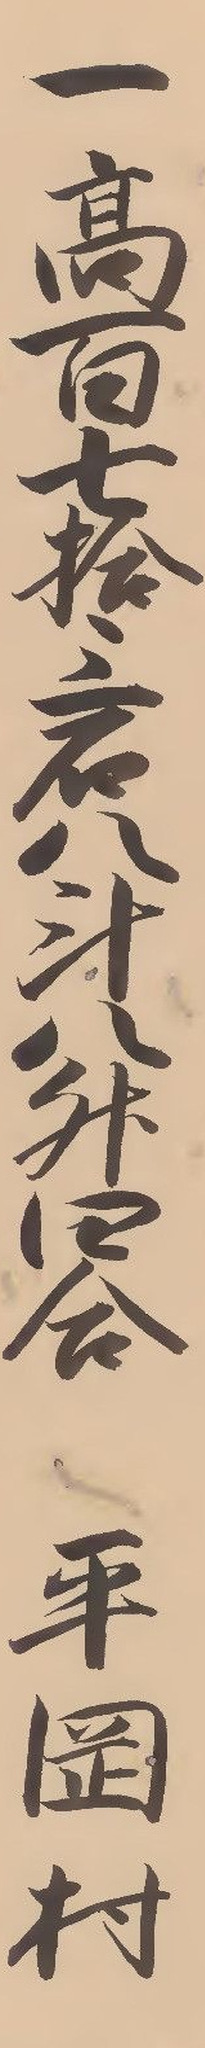一高百七拾三石八斗八升四合平岡村
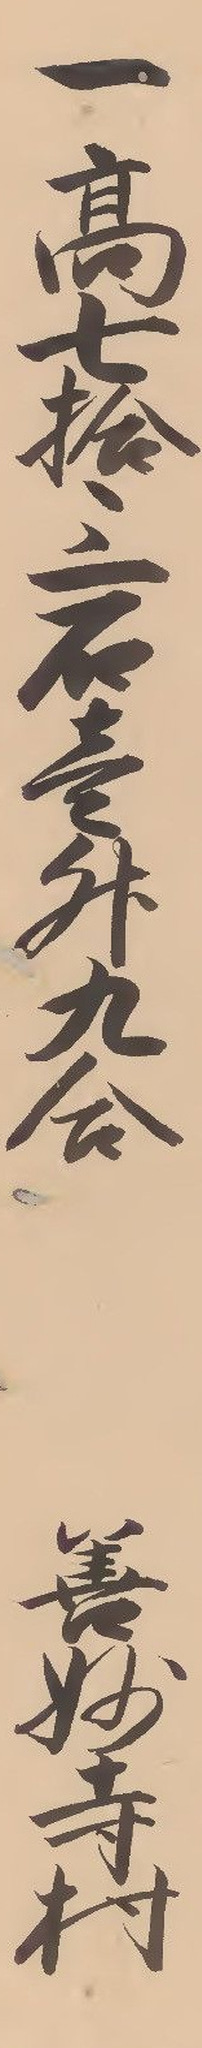一高七拾三石壱升九合善妙寺村

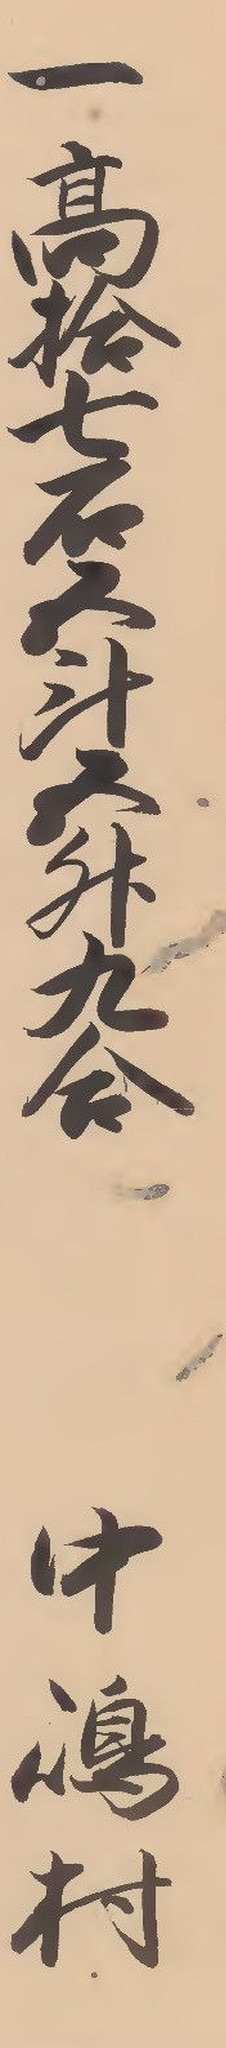一高拾七石五斗五升九合中嶋村
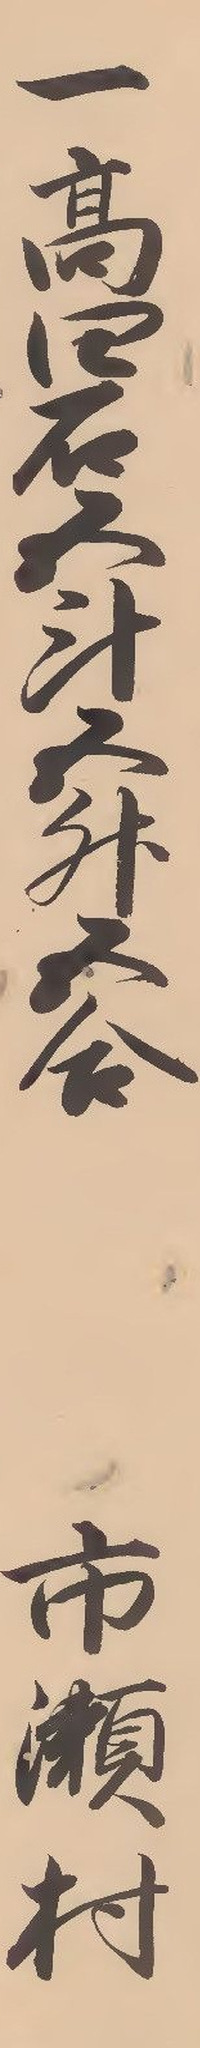一高四石五斗五升五合市瀬村
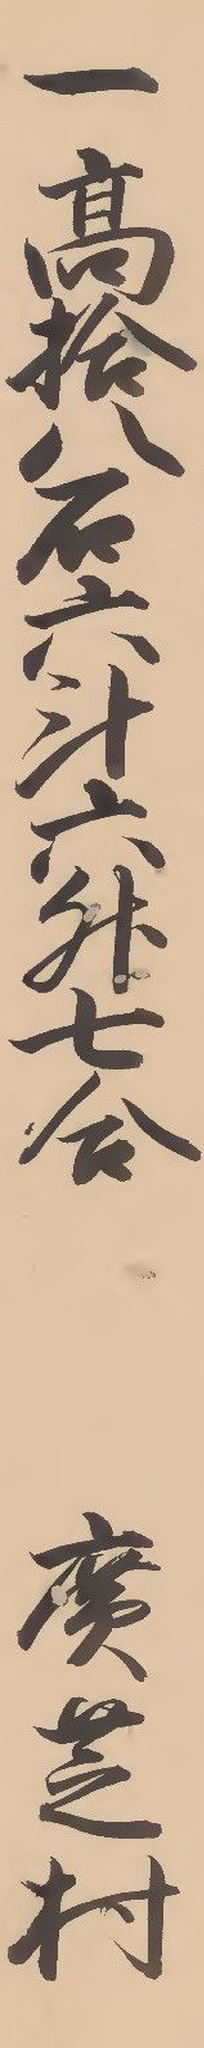一高拾八石六斗六升七合広芝村
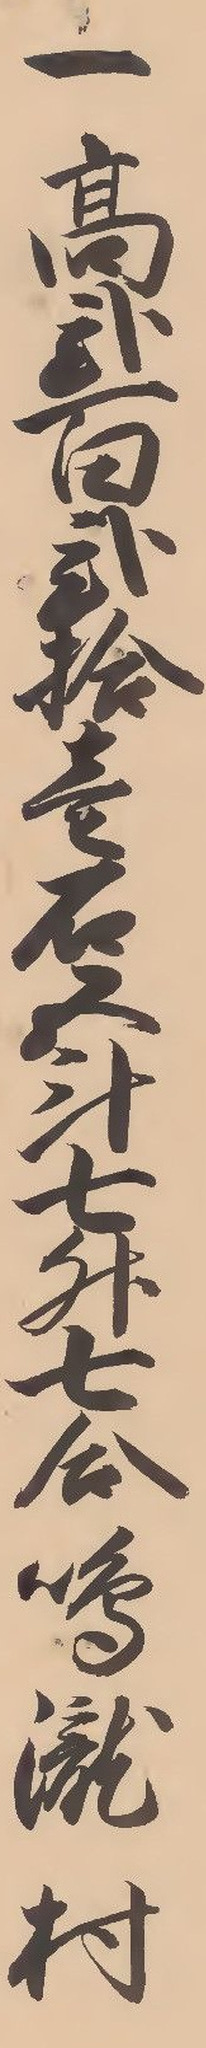一高弐百弐拾壱石五斗七升七合鳴滝村
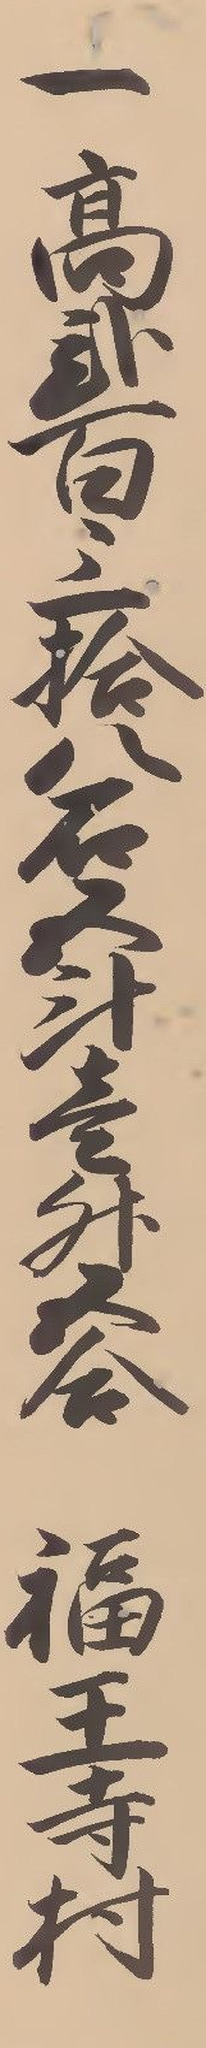一高弐百三拾八石五斗壱升五合福王寺村
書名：山城国郷帳
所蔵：国立公文書館 National Archives of Japan
